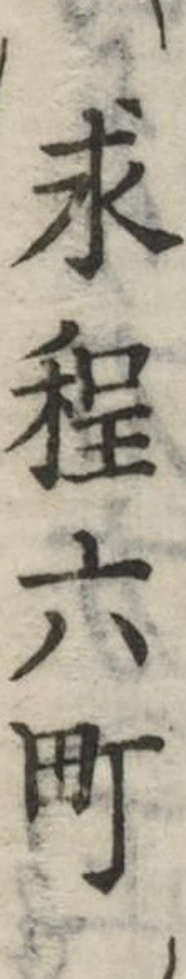求程六町

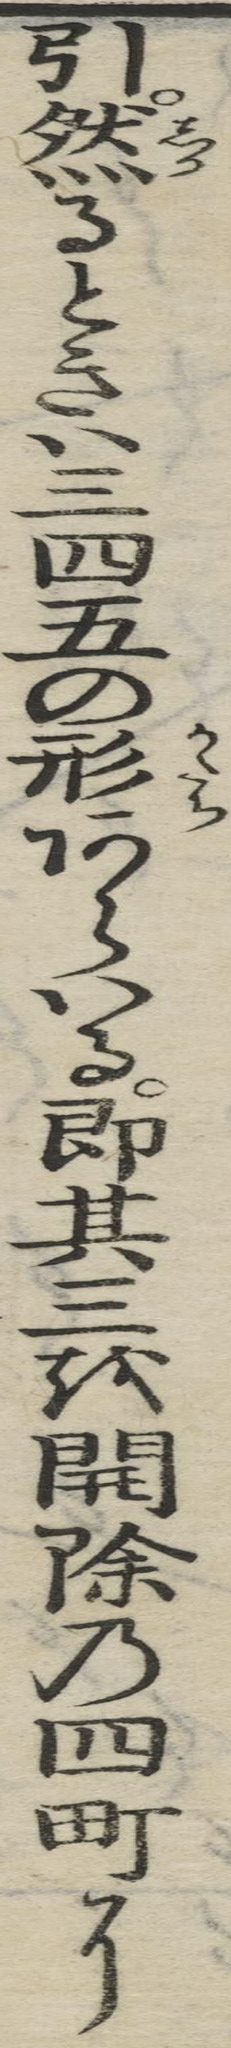引。然るときは三四五の形あらはる。即其三を開除の四町に
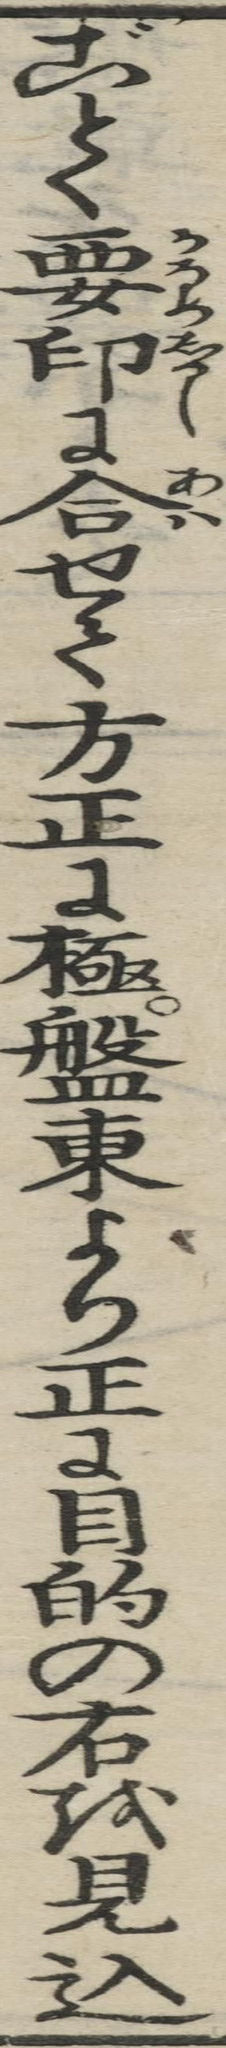ごとく要印に合せて方正に極。盤東より正に目的の右を見込
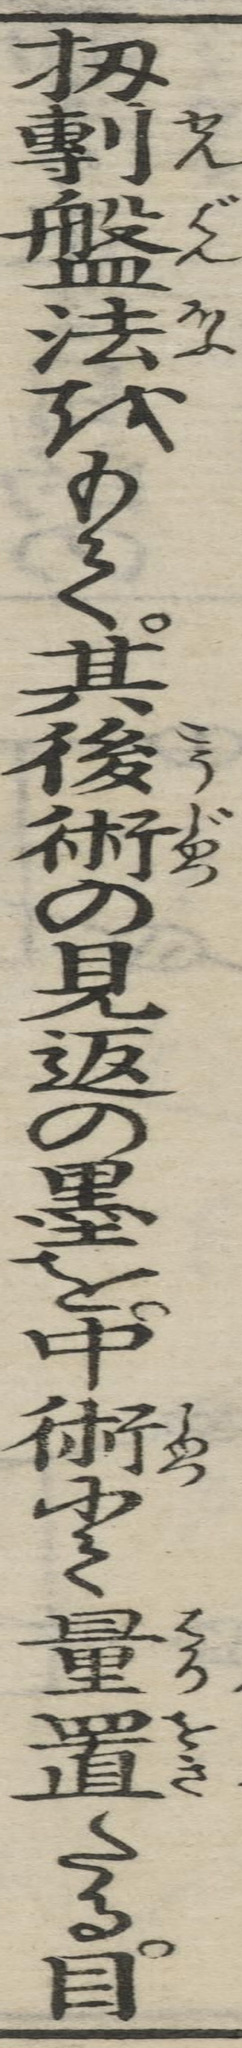扨剸盤法をもて。其後術の見返の墨を。中術にて量置たる。目
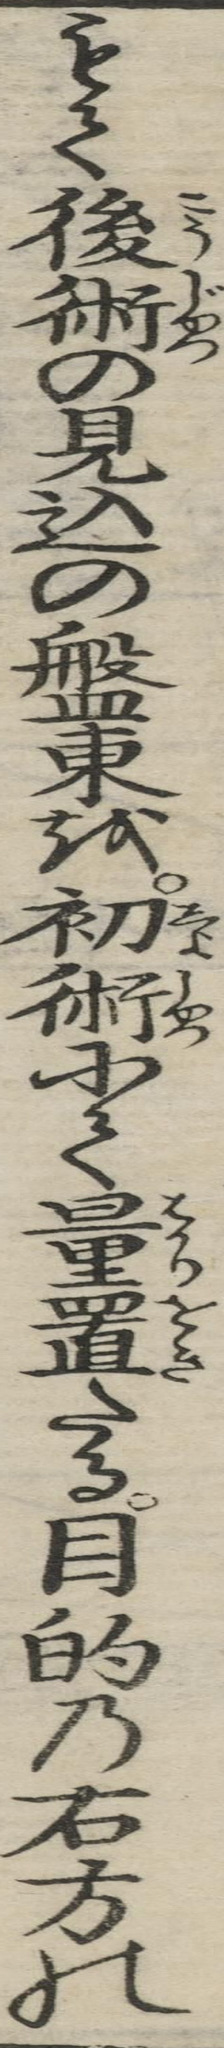もて後術の見込の磐東を。初術にて量置たる。目的の右方の
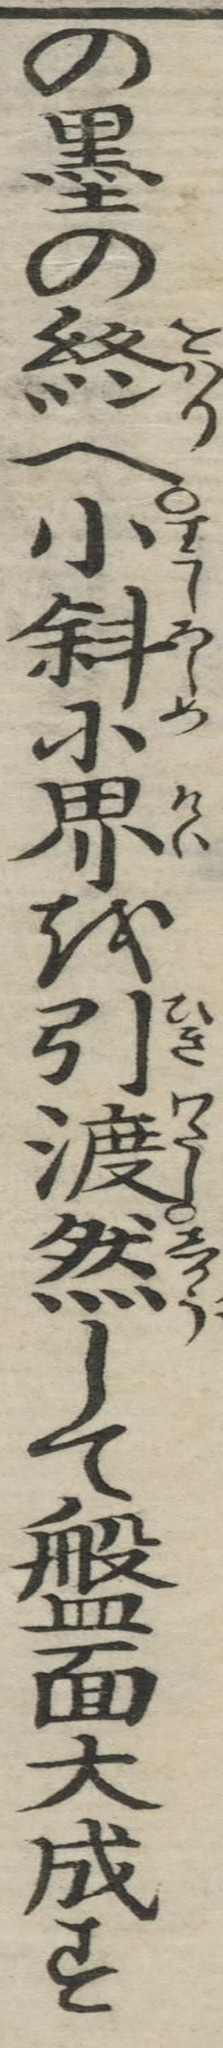の墨の終へ。小斜に界を引渡。然して盤面大成す
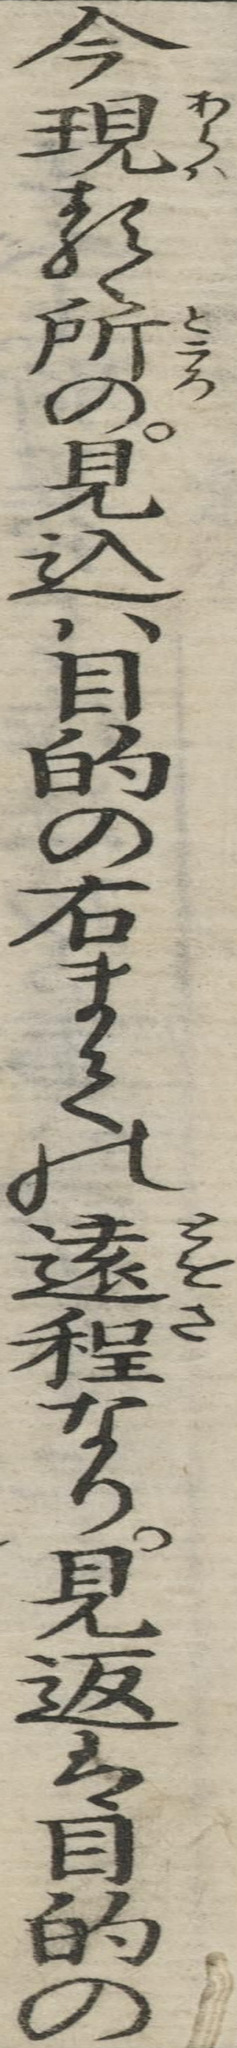今現るゝ所の。見込は目的の右まての遠程なり。見返は目的の
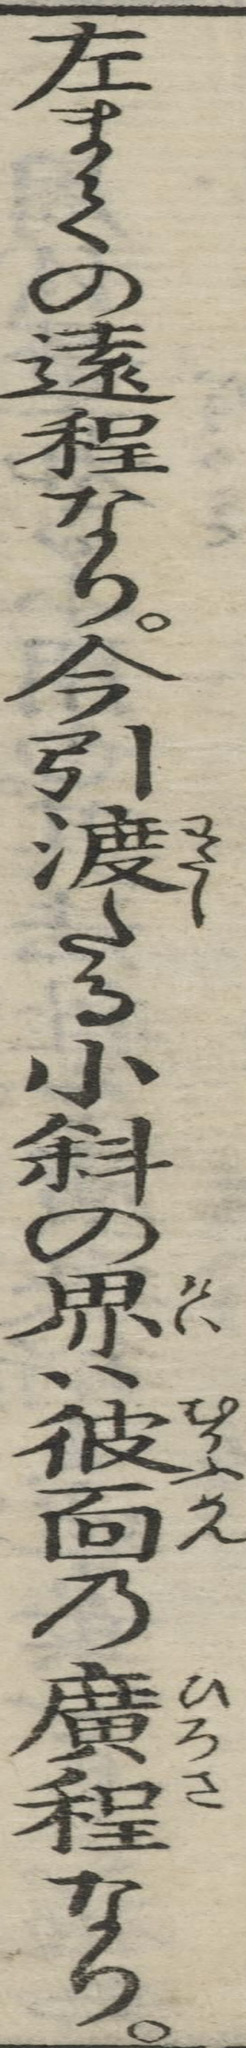左まての遠程なり。今引渡たる小斜の界は彼面の広程なり。
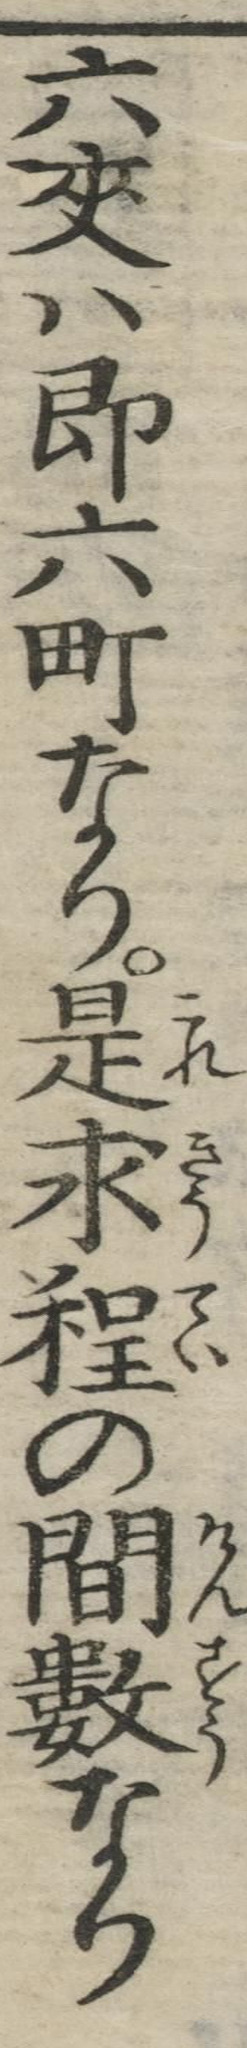六夾ハ即六町なり。是求程の間数なり

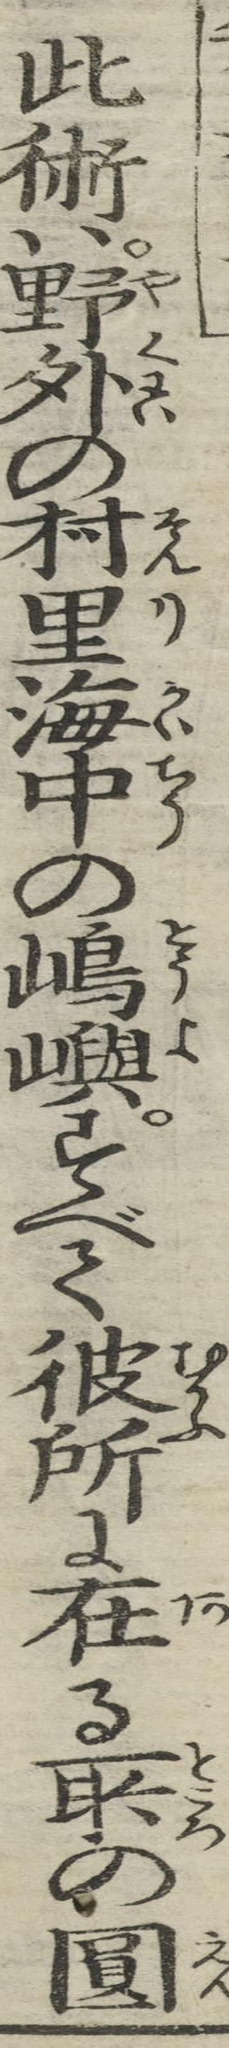此術は。野外の村里海中の嶋嶼。すべて彼所に在る所の圓
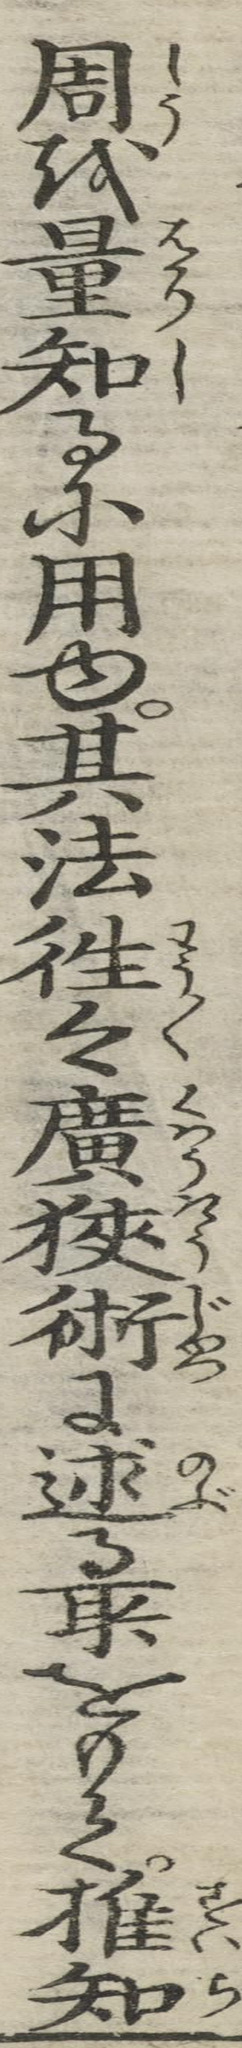周を量知るに用ゆ。其法往々広狭術に述る所をもて。推知
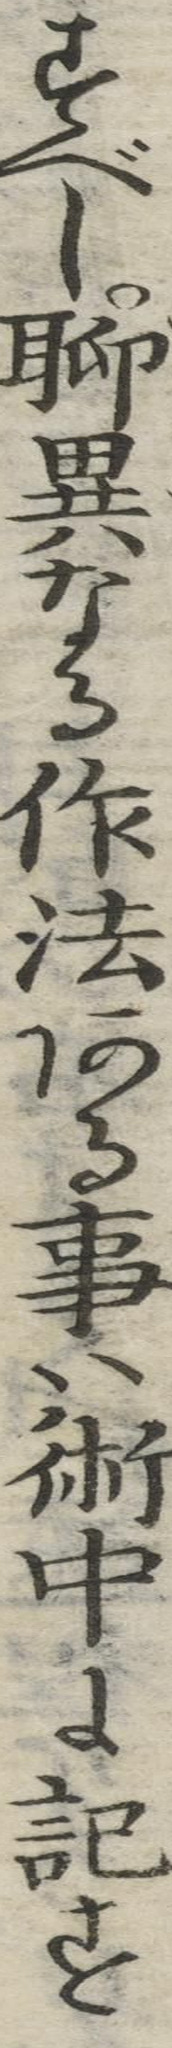すべし。聊異なる作法ある事は術中に記す
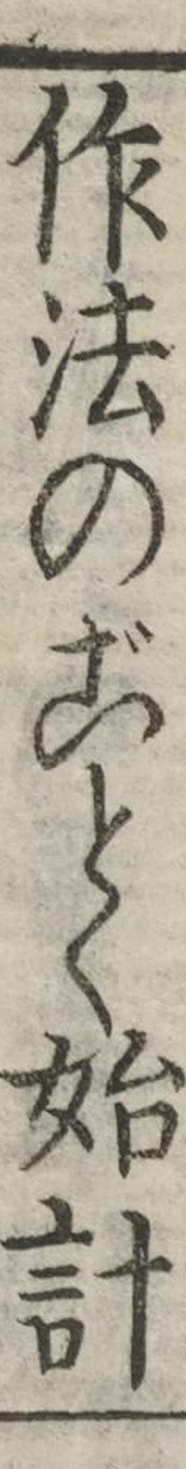作法のごとく始計
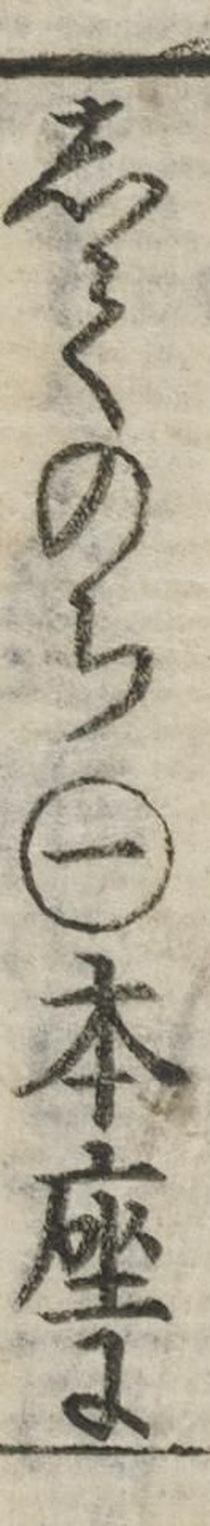してのち㊀本座に
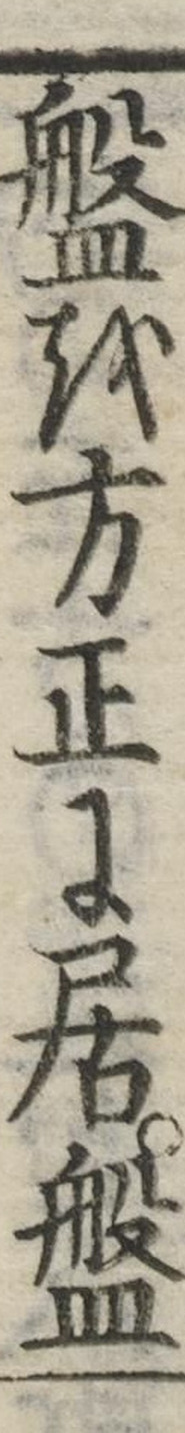盤を方正に居。盤
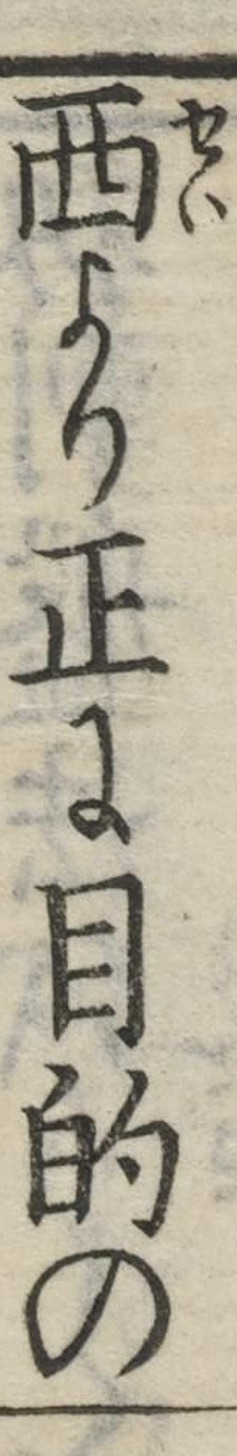西より正に目的の
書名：量地指南　巻之三（内題）
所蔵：東京大学地震研究所図書室 Earthquake Research Institute Library, The University of Tokyo, JAPAN
